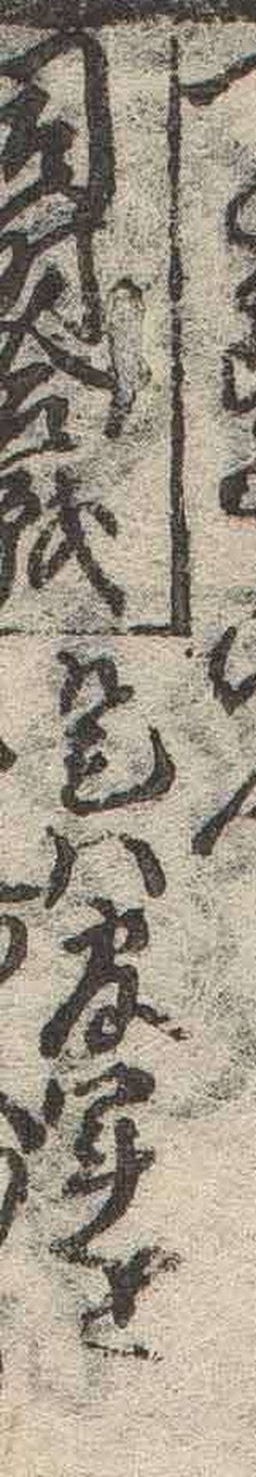同時合戦是は官軍を
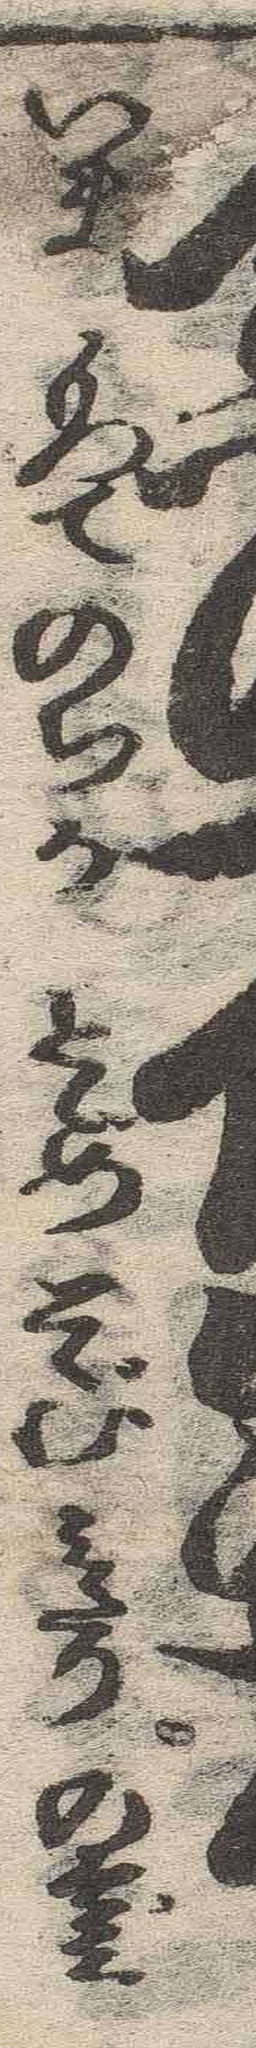いまもつてのちかとゞめとゞむみたりのぞみ
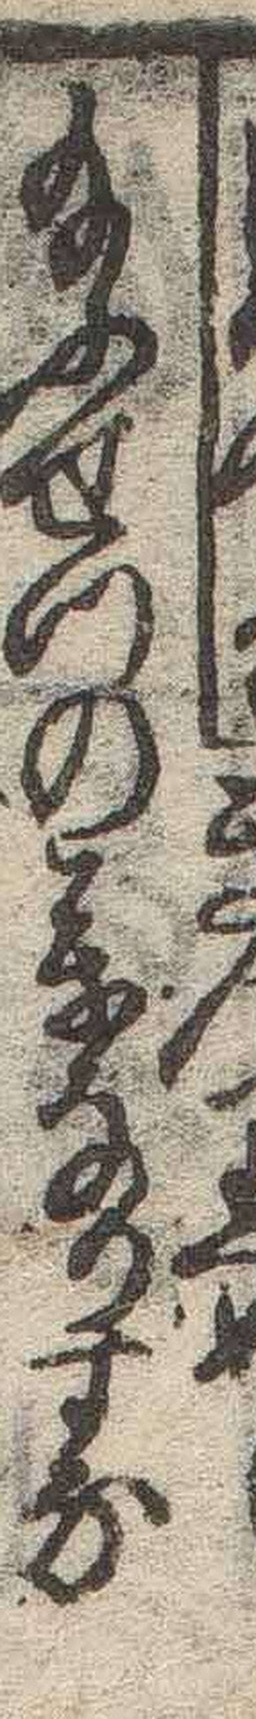給ふせつの義なりすな
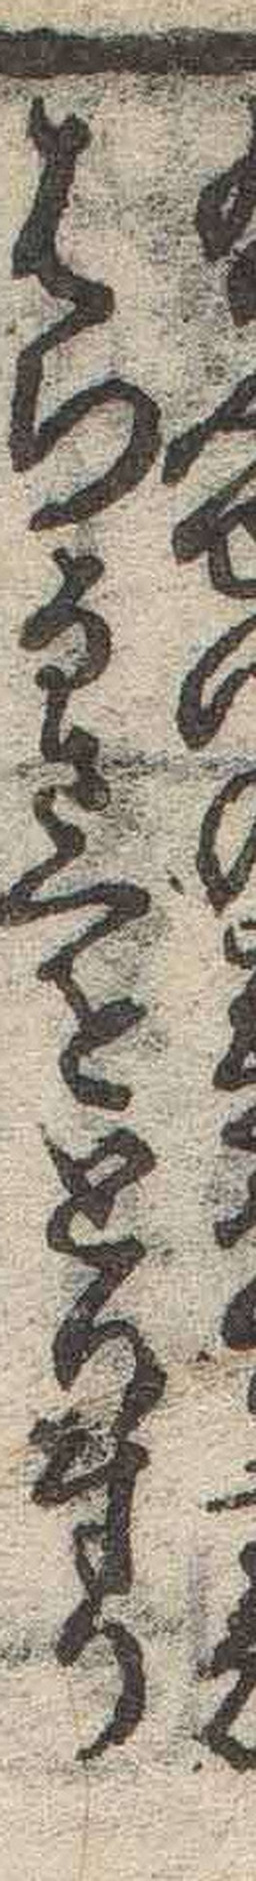はちるさいをとり奉り
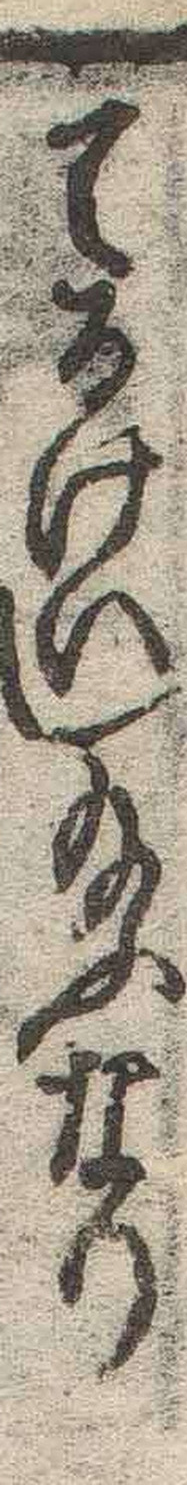てるけいし給ふなり
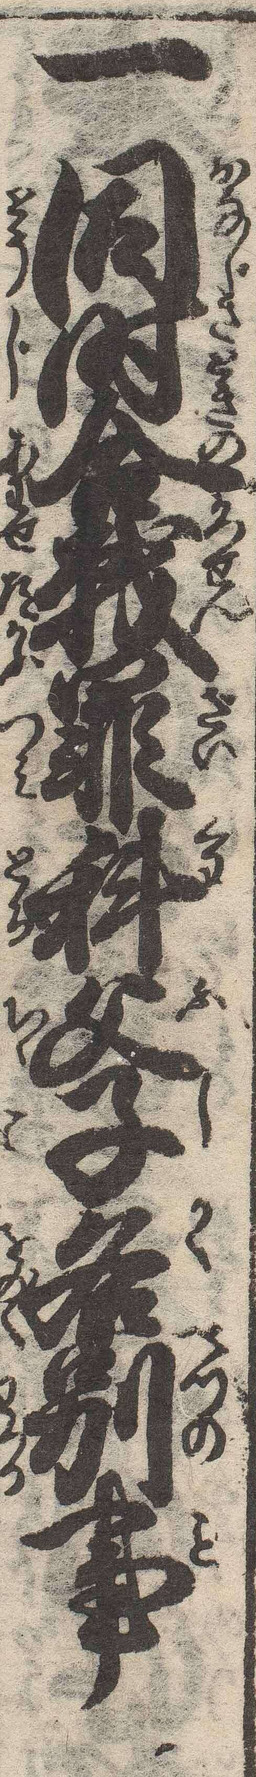一同時合戦罪科父子各別事
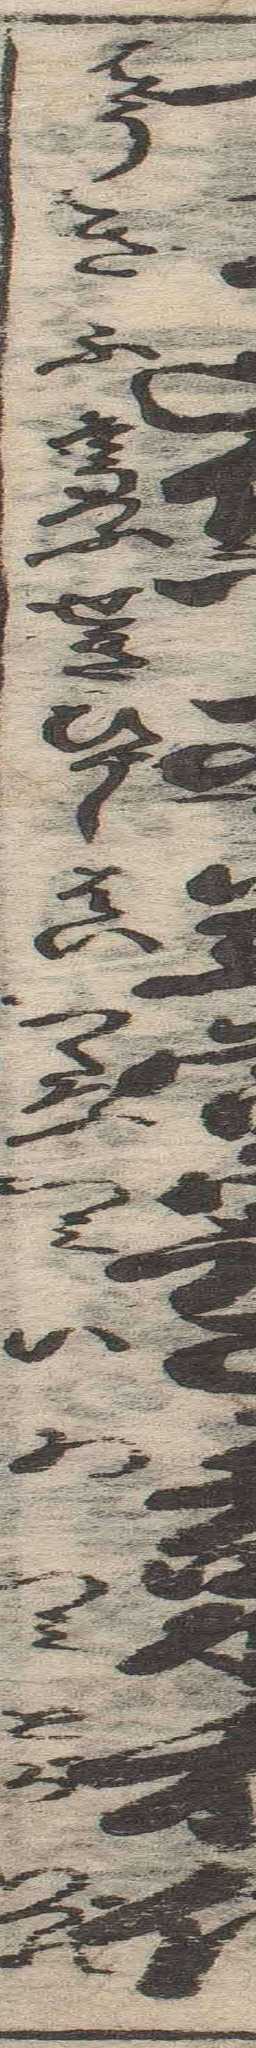はうきふそうろふせきひがしはいつくろふつみいゐつみとがいづれ
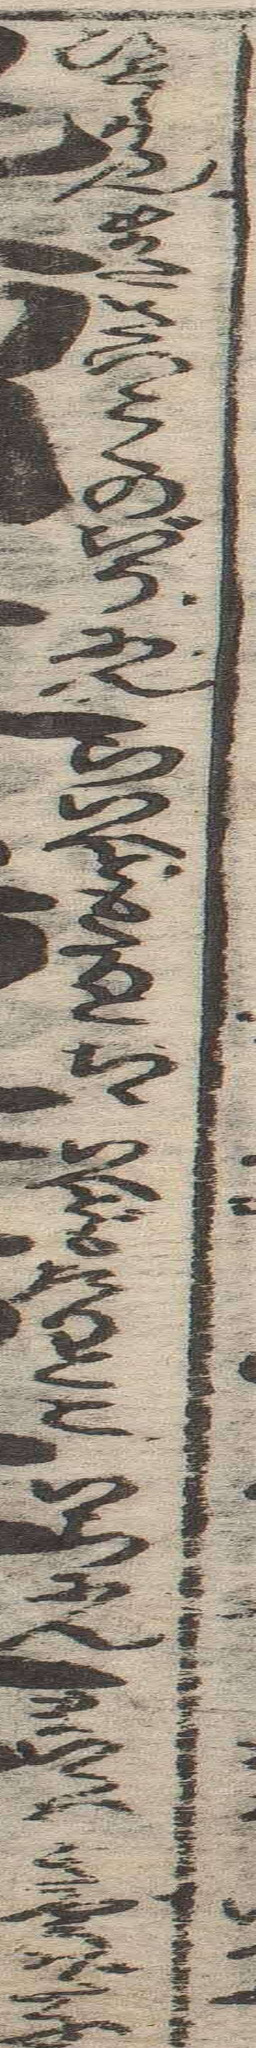ひとしからんまたさいこくのぢうにんらいへともたりとちゝいへどもたりとこいちにんまいらはきやうがたに
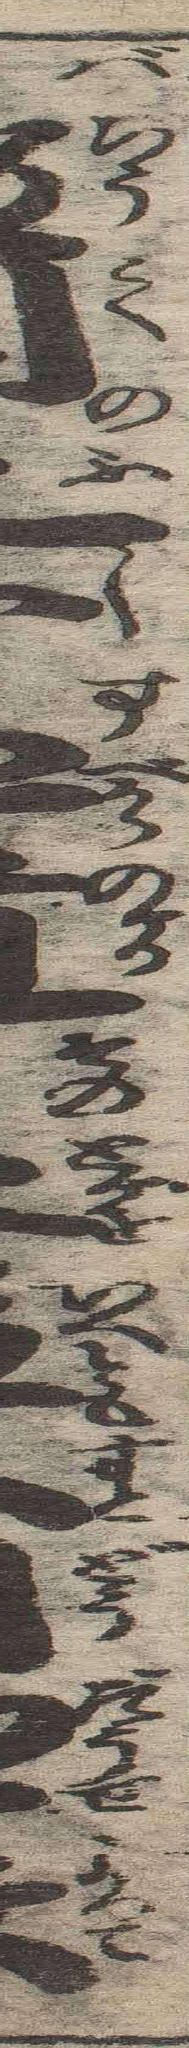ばちうこくのふしすべからのかるそのとがをいへともすとどうだうせよつて

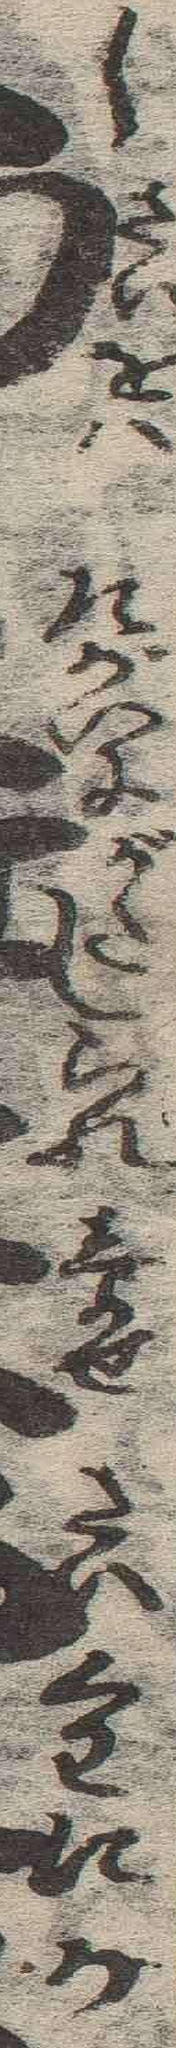しさいをはたがいにがたしられしよせさいくわにか
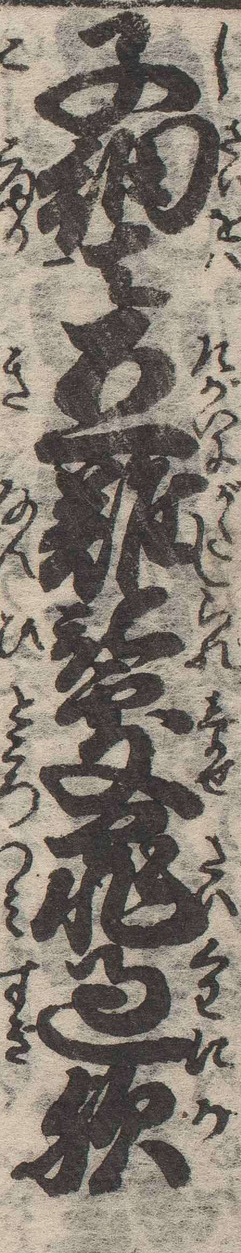子細者互難被處罪過欤
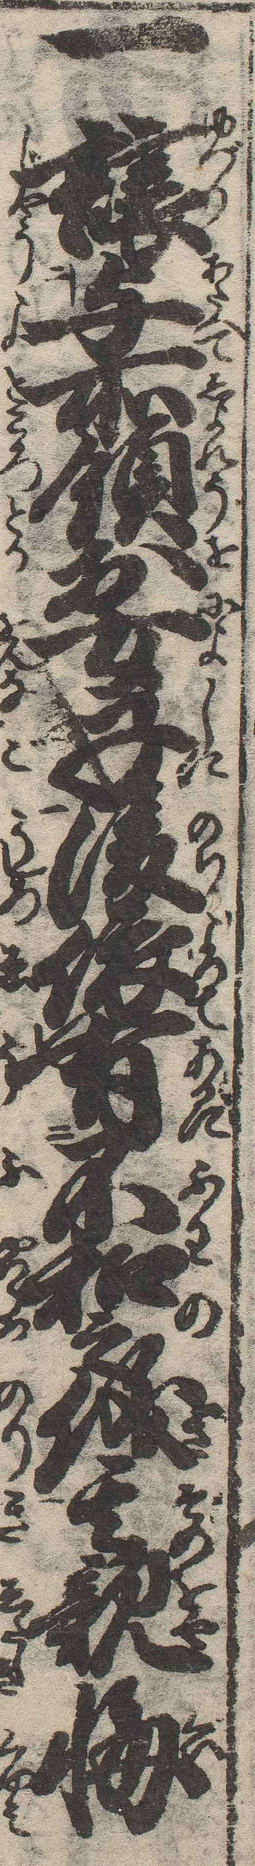一譲与所領於女子後依有不和之儀其親悔
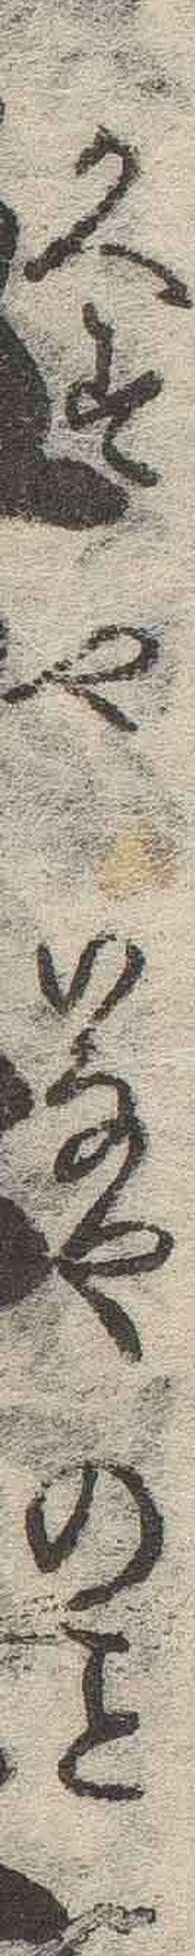かへすやいなやのこと
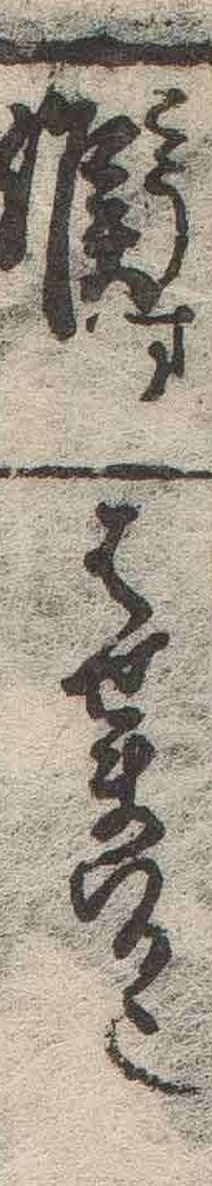候はせまいる也
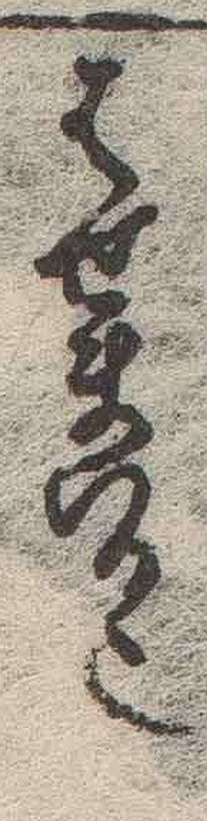候はせまいる也
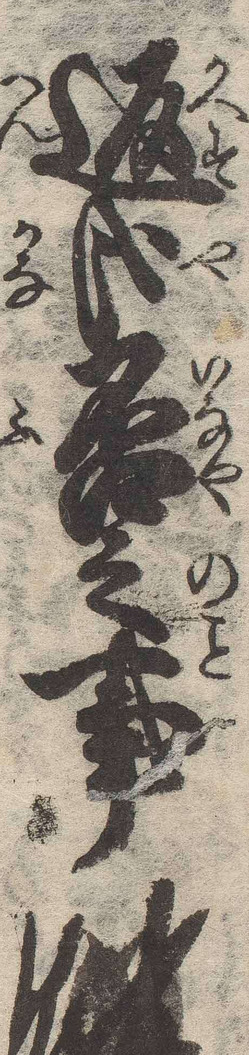返哉否之事
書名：御成敗式目絵抄
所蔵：東京学芸大学附属図書館 国文学研究資料館
